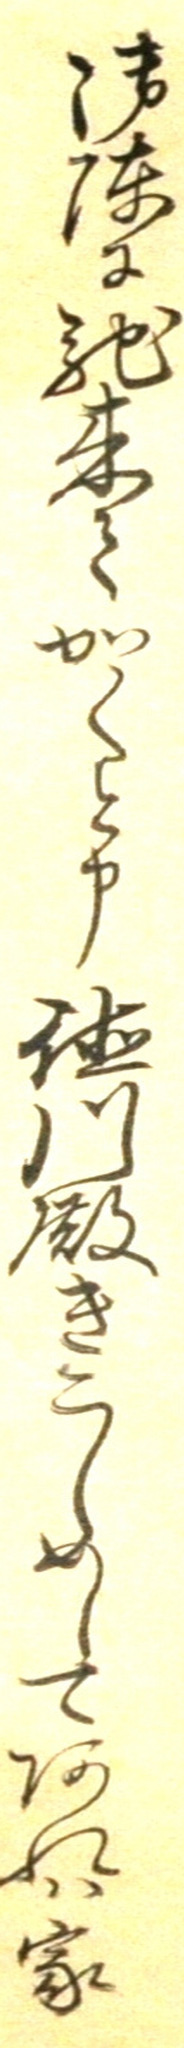御陣に馳来てかくと申徳川殿きこしめしてあれは家
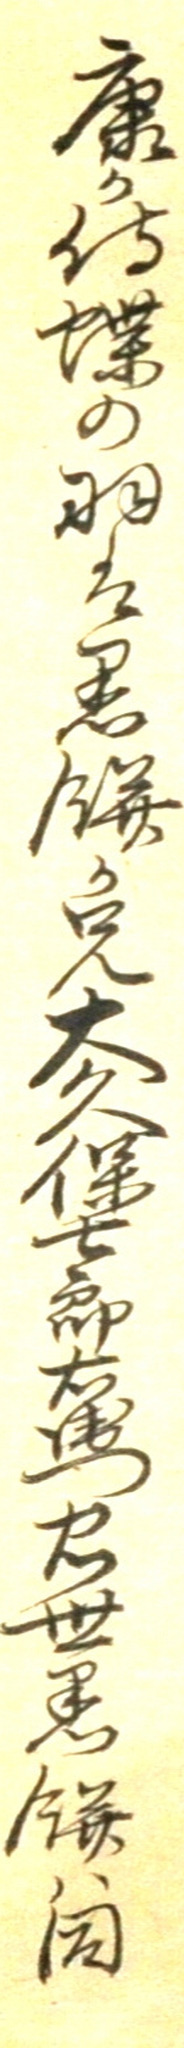康か侍蝶の羽は黒餅か兄大久保七郎右衛門忠世黒餅は同
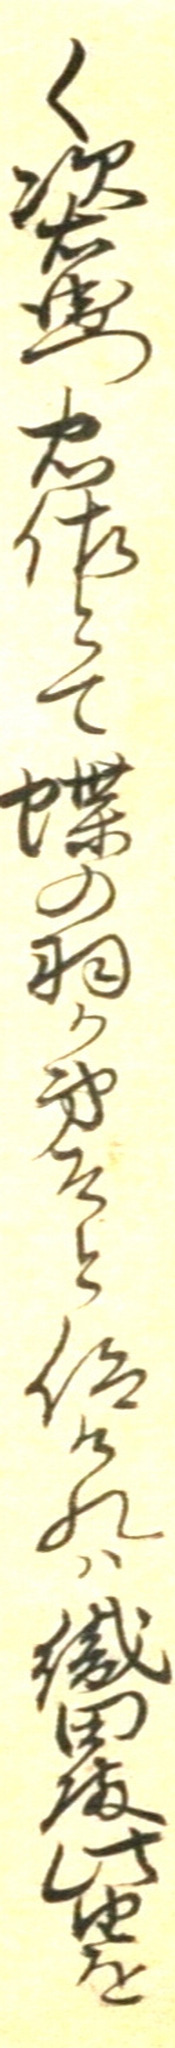く治右衛門忠佐とて蝶の羽か弟そと仰けれは織田殿此由を
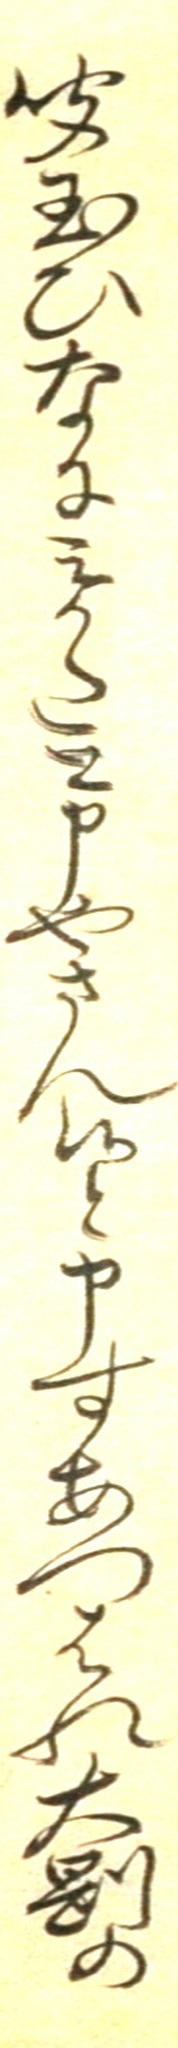聞玉ひなにみかたと申やさん候と申すあつはれ大剛の
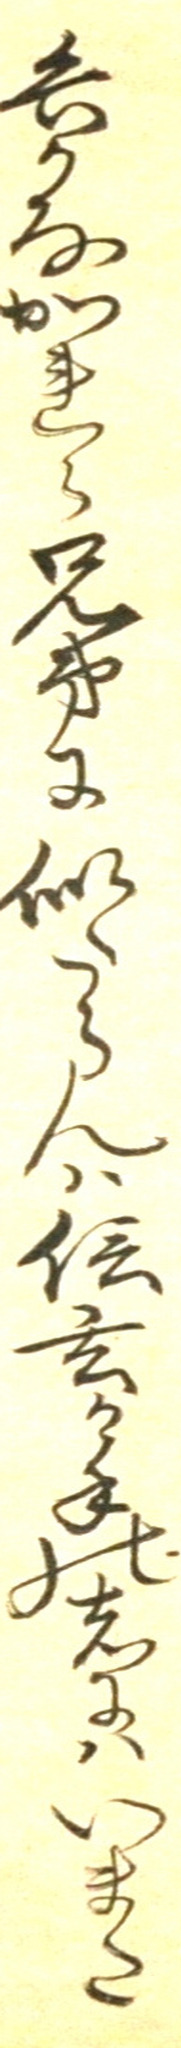兵かなかれら兄弟に似たらんは信玄か手の者にはいまた
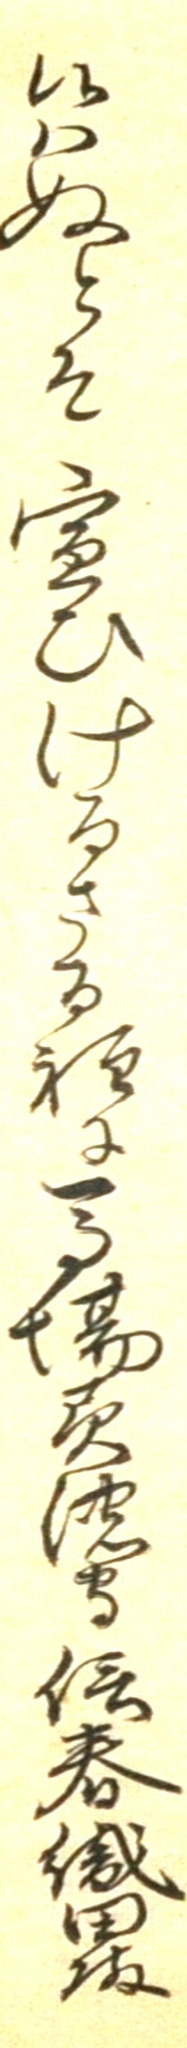候はぬとそ宣ひけるさる程に馬場美濃守信春織田殿
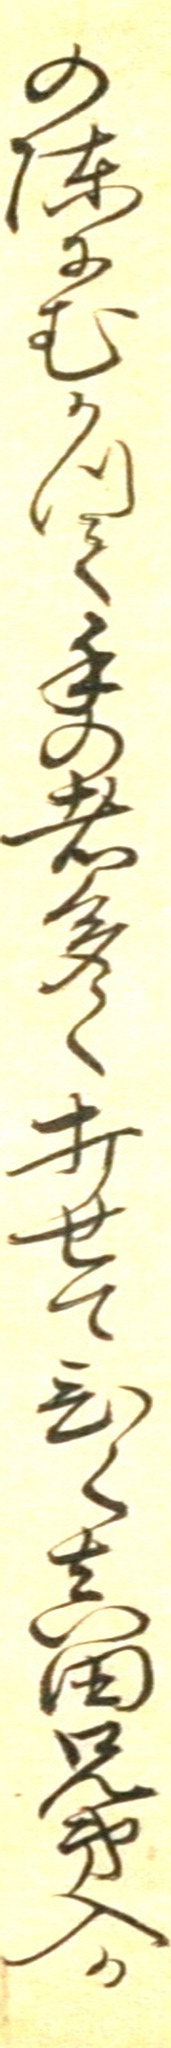の陣にむかつて手の者多く打せてひく真田兄弟入か
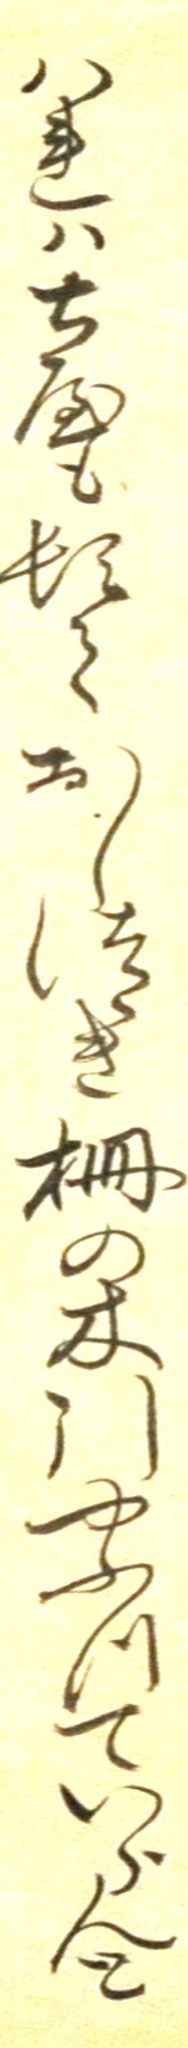はれは土屋も頓ておしつゝき柵の木引やふつていらんと
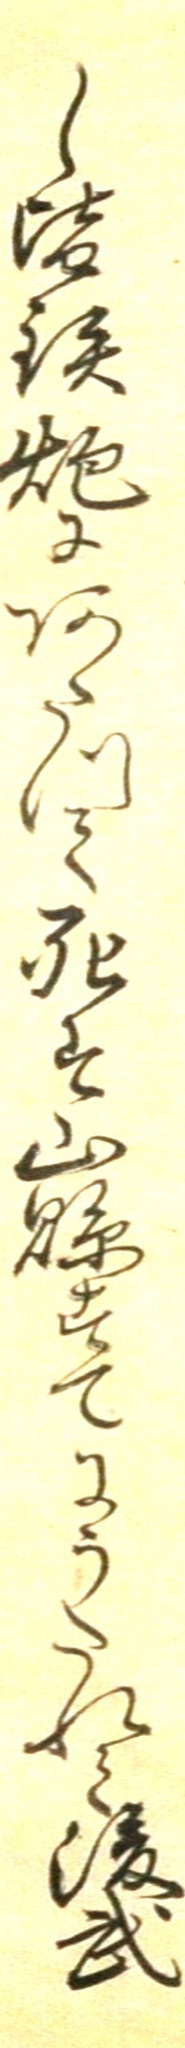し皆鉄炮にあたつて死す山縣すてにうたれて後武
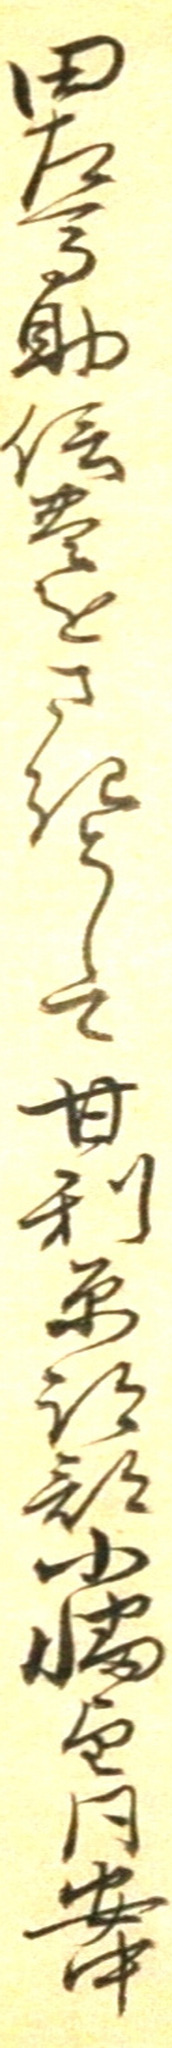田左馬助信豊をさきとして甘利原跡部小幡望月安中
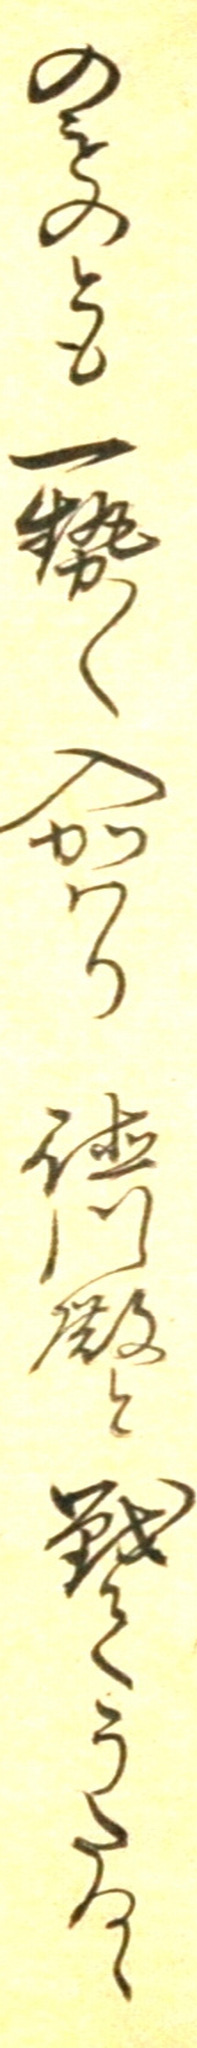のものとも一勢〳〵入かわり徳川殿と戦てうたるゝ
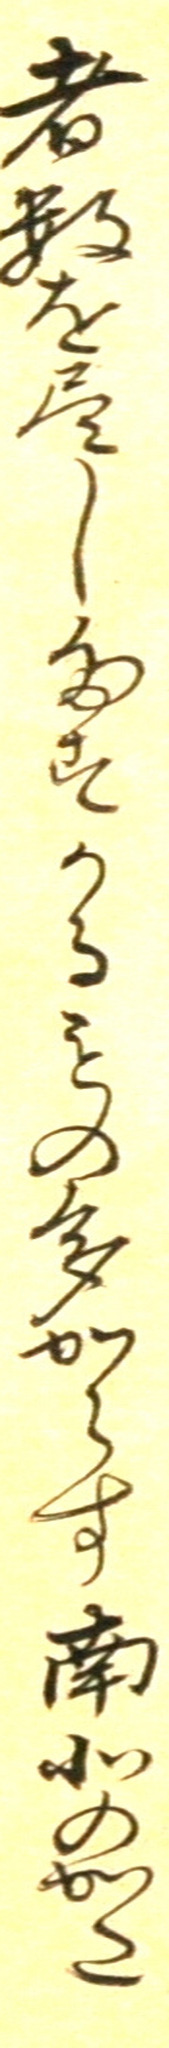者数を尽したすかるもの多からす南北のかた

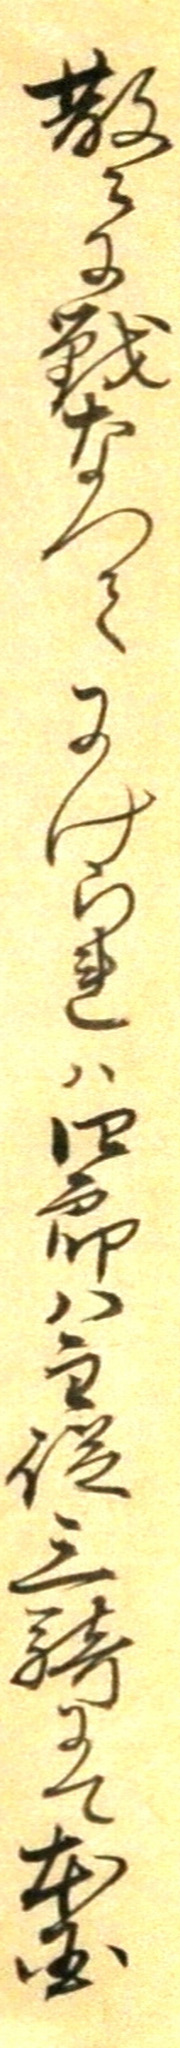散々に戦なつてにけられは四郎は主従三騎にて本国
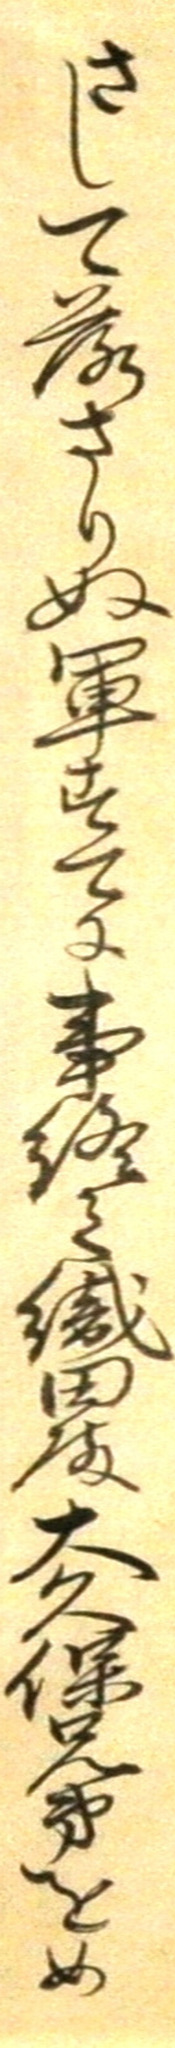さして落さりぬ軍すてに事終て織田殿大久保兄弟をめ
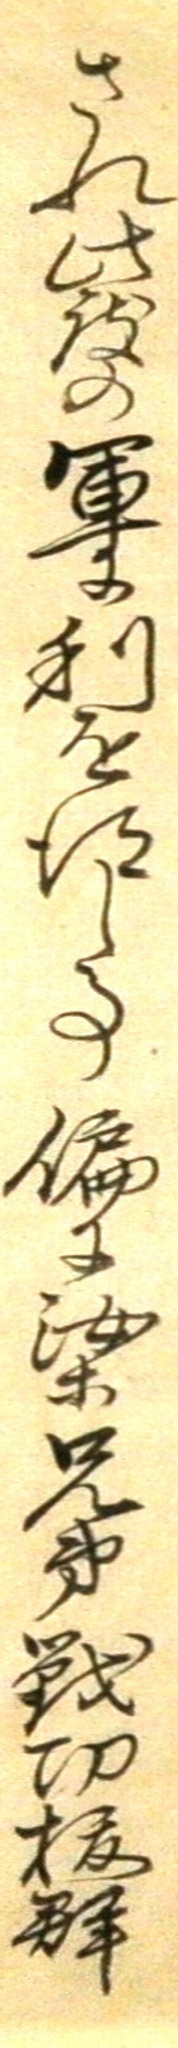され此度の軍に利を得し事偏に汝等兄弟戦功抜群
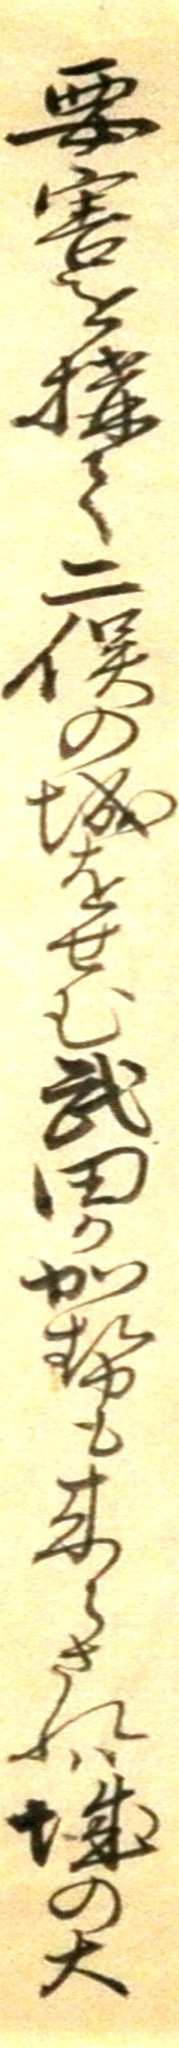要害を構て二俣の城をせむ武田か加勢も来らされは城の大
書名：藩翰譜（四・中）
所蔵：伊那市立高遠町図書館・合同会社AMANE
